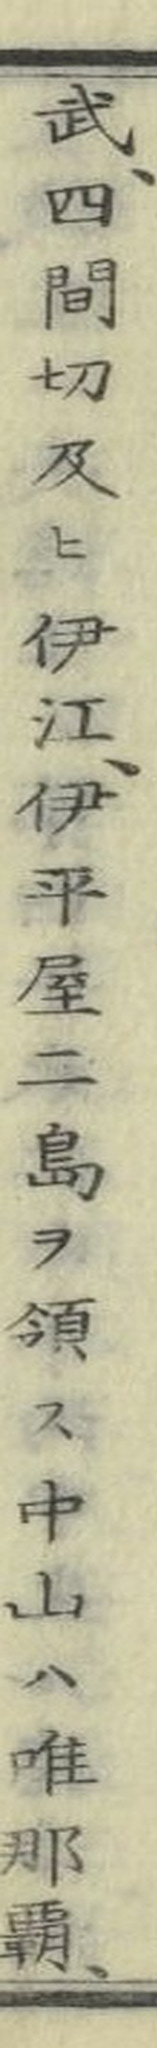武、四間切及ヒ伊江、伊平屋二島ヲ領ス中山ハ唯那覇、
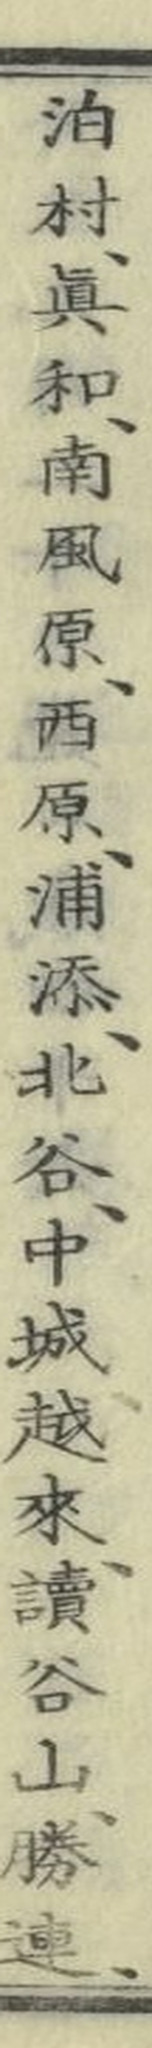泊村、眞和、南風原、西原、浦添、北谷、中城、越来、讀谷山、勝連、
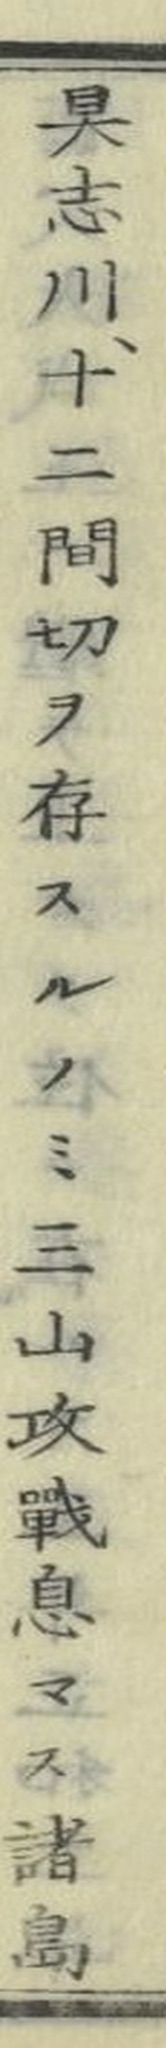具志川、十二間切ヲ存スルノミ三山攻戰息マス諸島
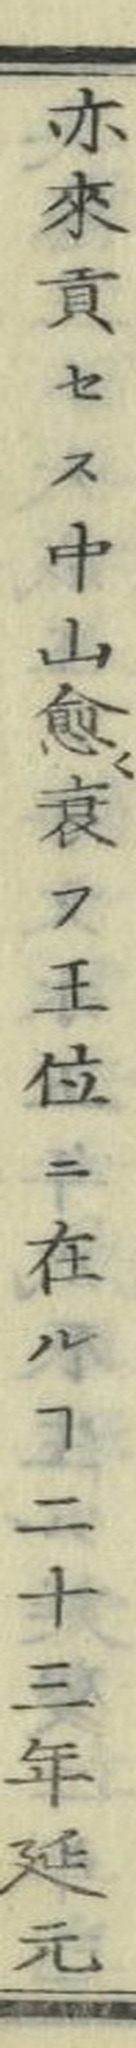亦來貢セス中山愈〻衰フ王位ニ在ルコト二十三年延元
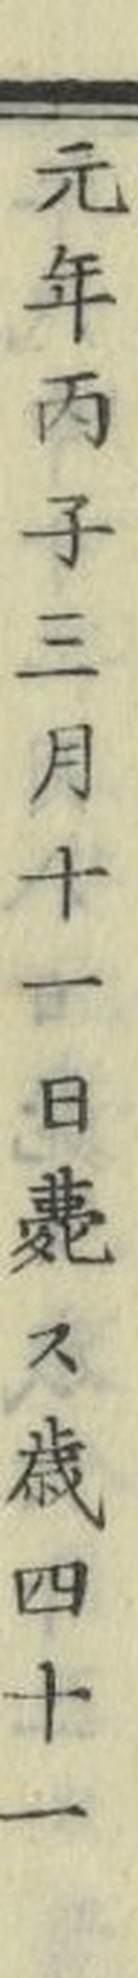元年丙子三月十一日薨ス歳四十一
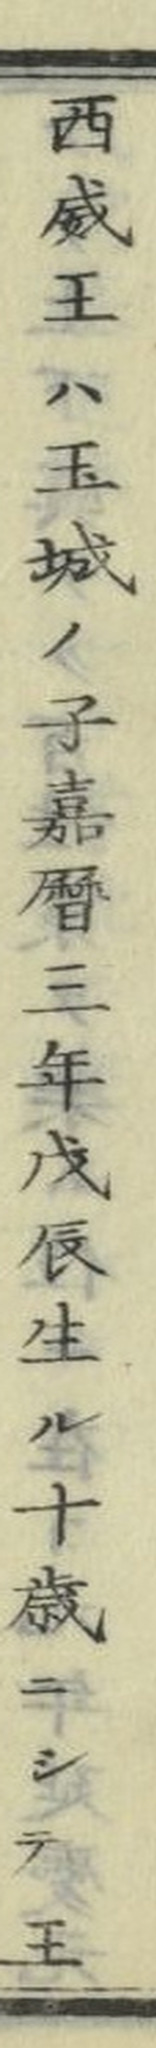西威王ハ玉城ノ子嘉曆三年戊辰生ル十歲ニシテ王
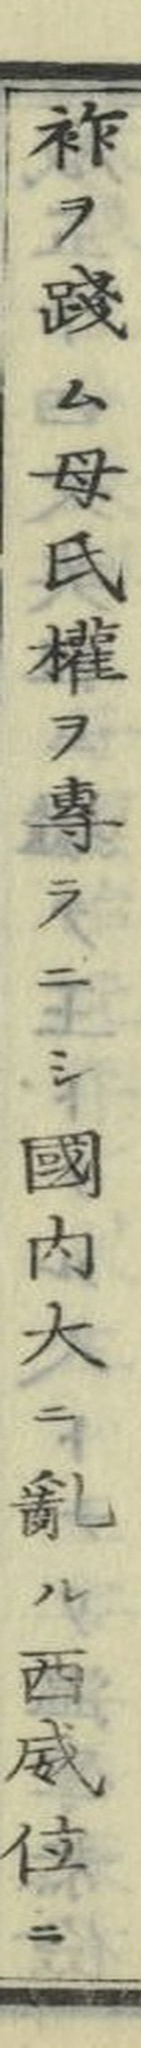祚ヲ踐ム母氏權ヲ専ラニシ國内大ニ亂ル西威位ニ
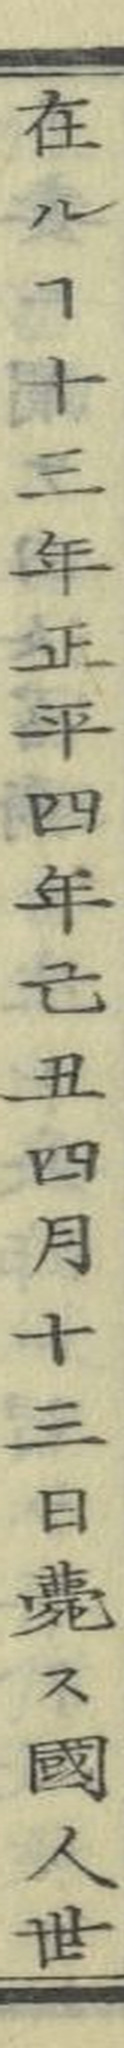在ルコト十三年正平四年己丑四月十三日薨ス國人世
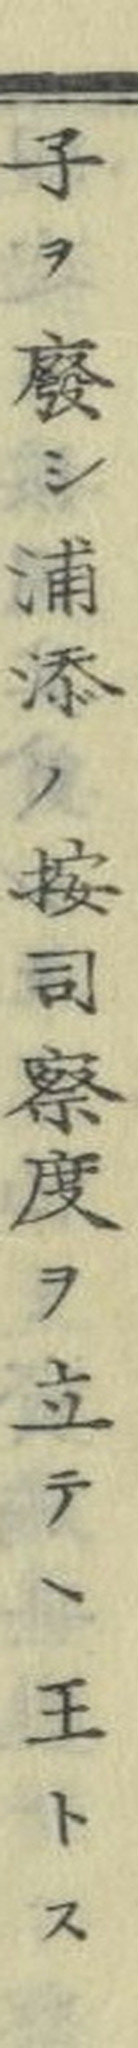子ヲ廢シ浦添ノ按司察度ヲ立テヽ王トス
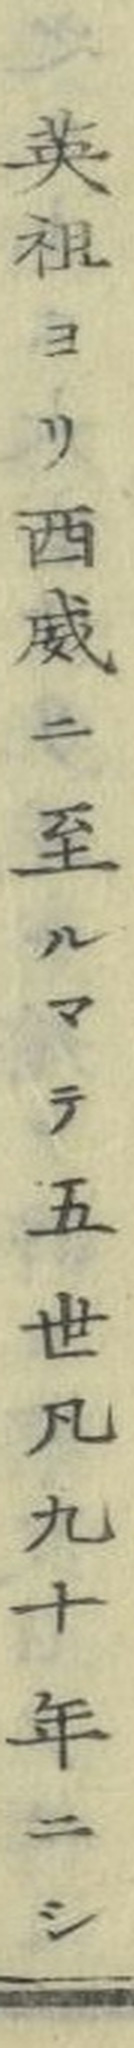英祖ヨリ西威ニ至ルマテ五世凡九十年ニシ
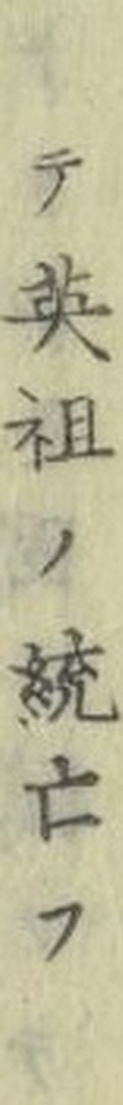テ英祖ノ統亡フ
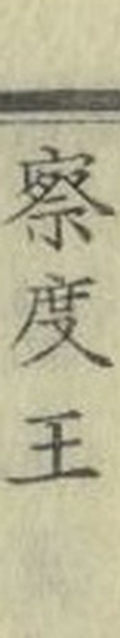察度王
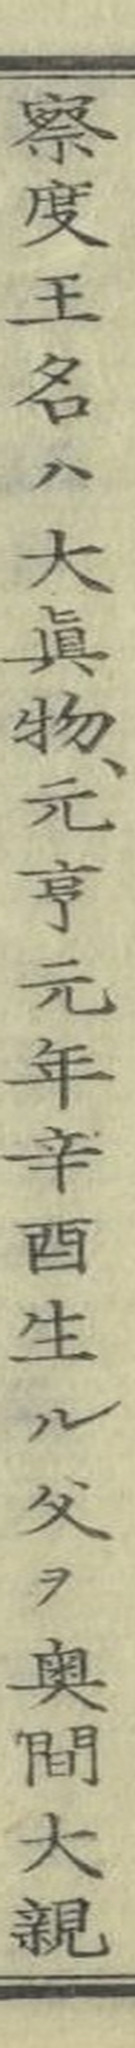察度王名ハ大眞物、元亨元年辛酉生ル父ヲ奥間大親
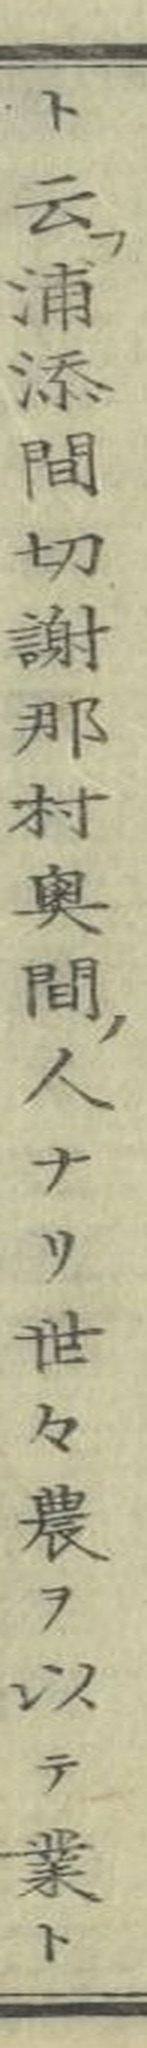ト云浦添間切謝那村奧間人ナリ世々農ヲ以テ業ト
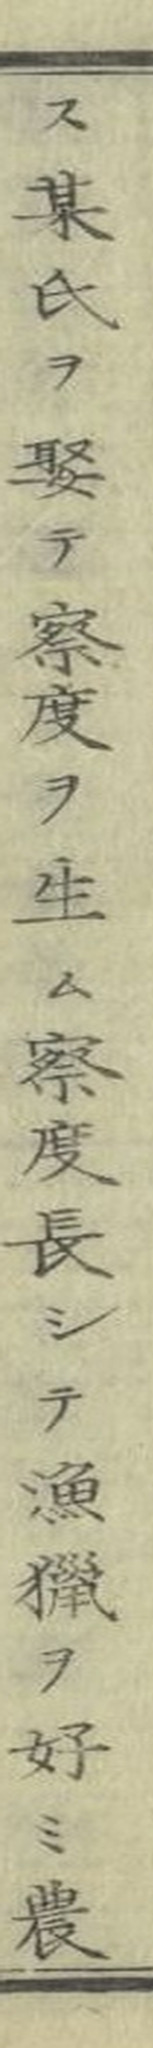ス某氏ヲ娶テ察度ヲ生ム察度長シテ漁猟ヲ好ミ農
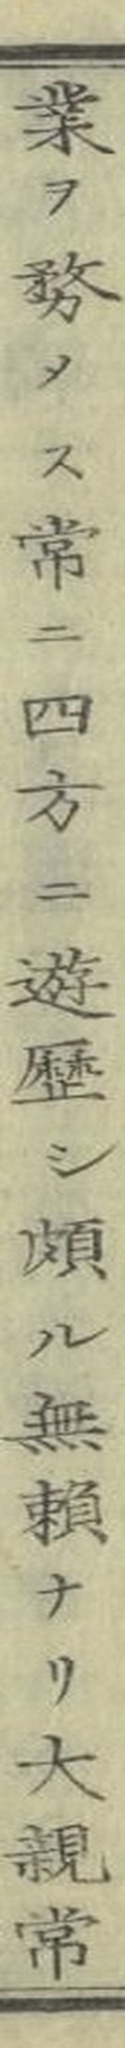業ヲ務メス常ニ四方ニ遊歷シ頗ル無頼ナリ大親常
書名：琉球藩史 一之巻
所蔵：University of the Ryukyus Library
